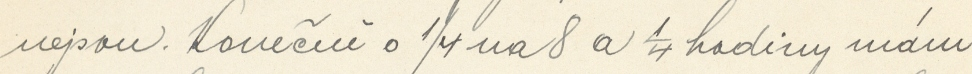nejsou. Konečně o 1/4 na 8 a 1/4 hodiny mám
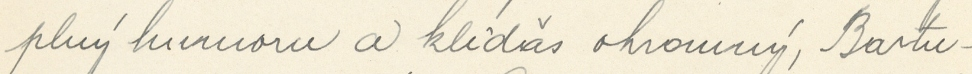plný humoru a kliďas ohromný, Bartu-
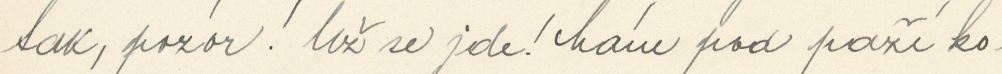tak, pozor! Už se jde! Mám pod paží ko-
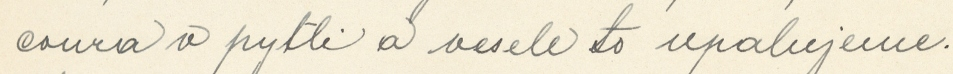coura v pytli a vesele to upalujeme.
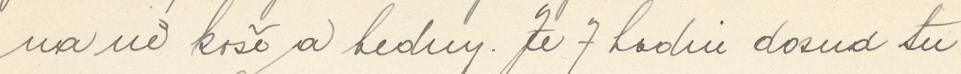na ně koše a bedny. Je 7 hodin dosud tu
